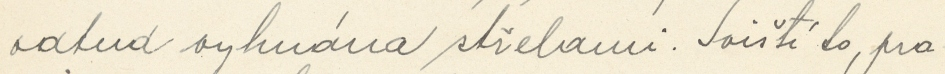odtud vyhnána střelami. Sviští to, pra-
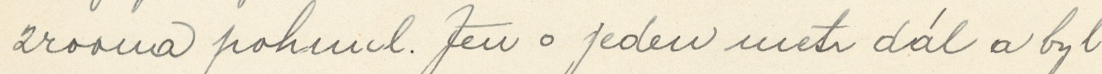zrovna pohnul. Jen o jeden metr dál a byl
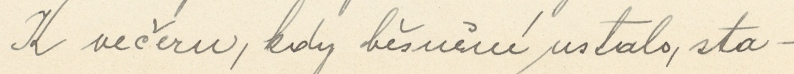K večeru, kdy běsnění ustalo, sta-
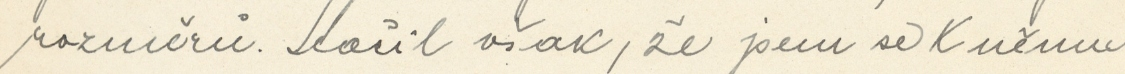rozměrů. Stačil však, že jsem se k němu
